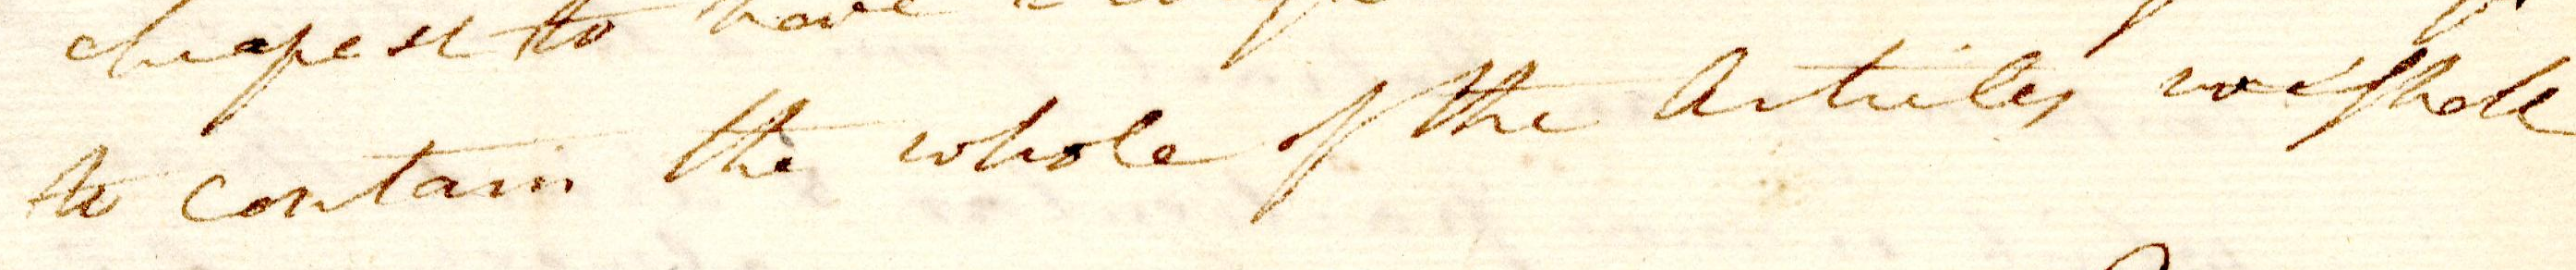to contain the whole of the Articles we Shall
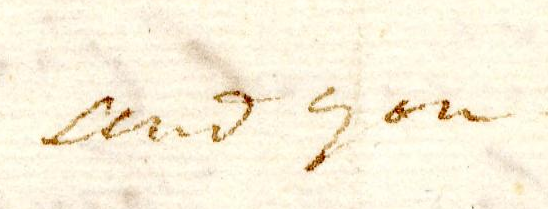send you.
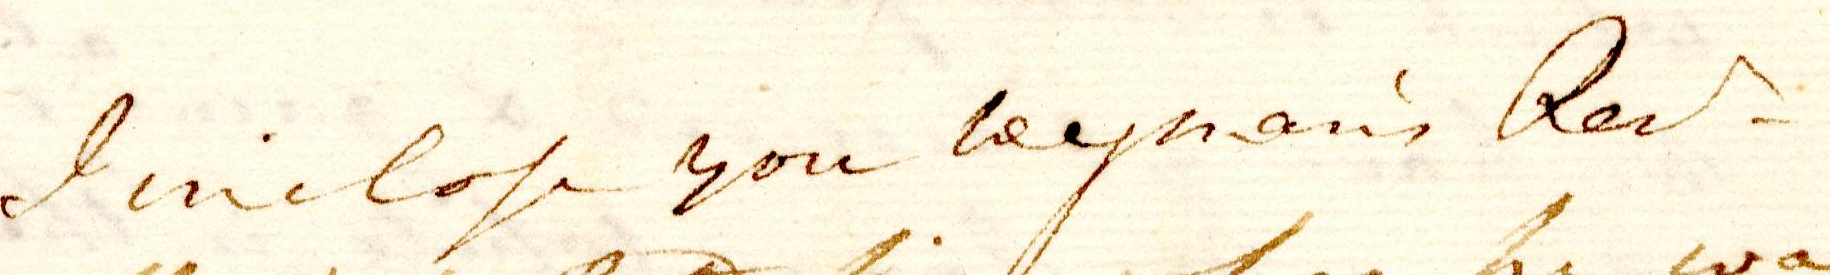I inclose you weyman's Rec^t.
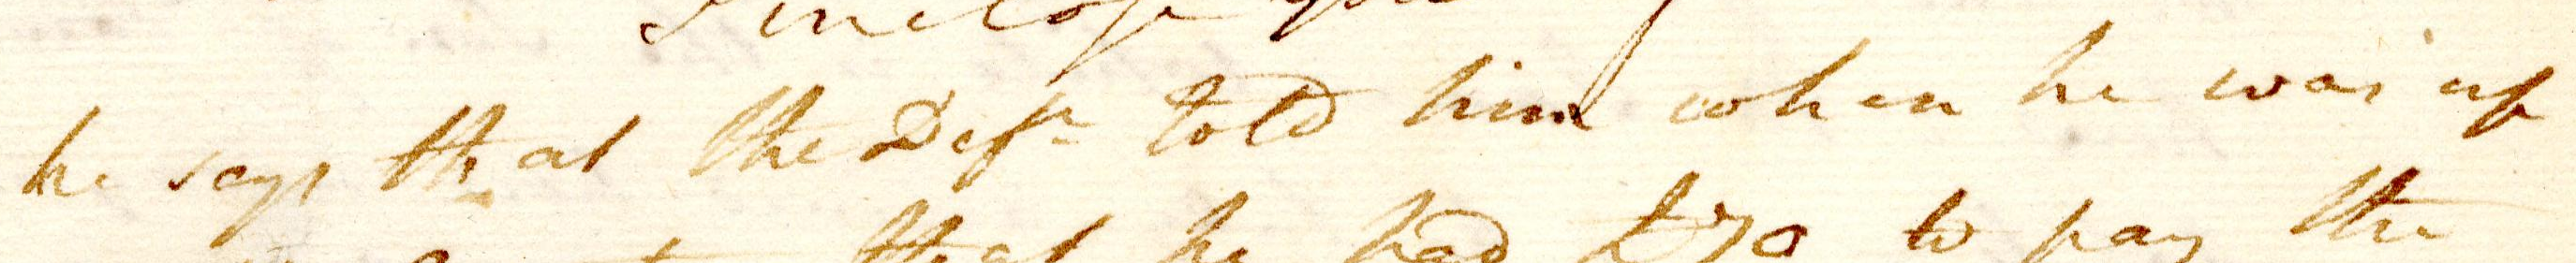he says that the Dep^t. told him when he was up
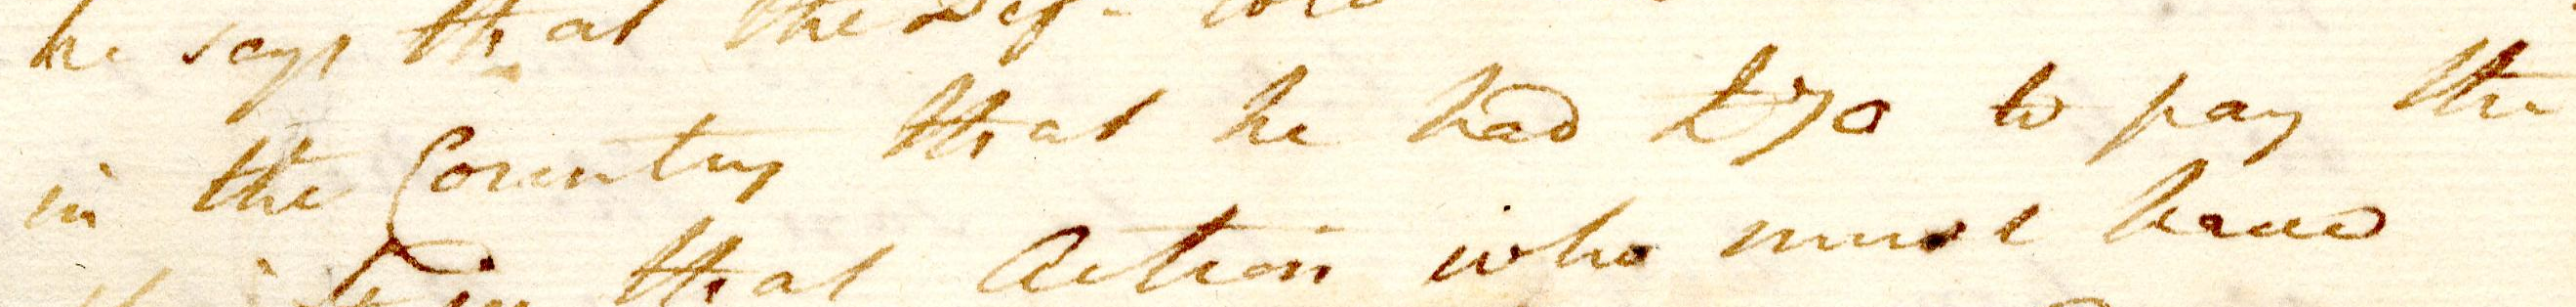in the Country that he had £70 to pay the
